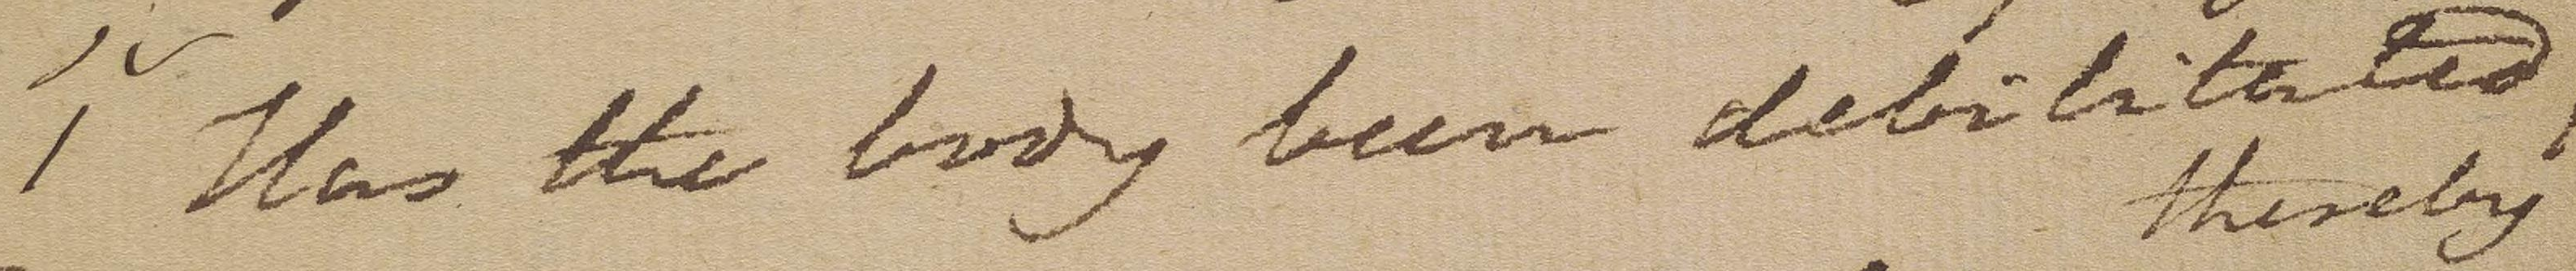Has the body been debilitated
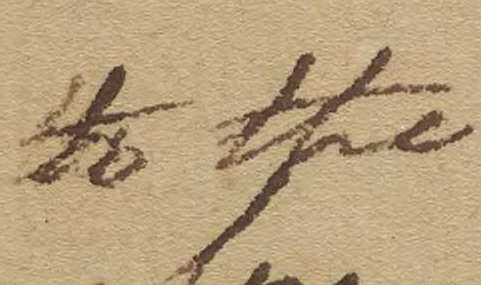to the
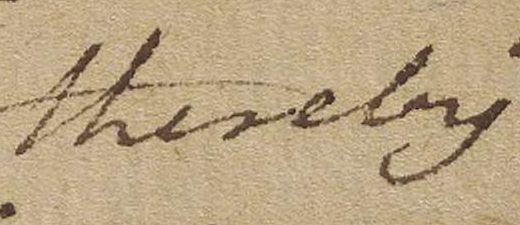thereby
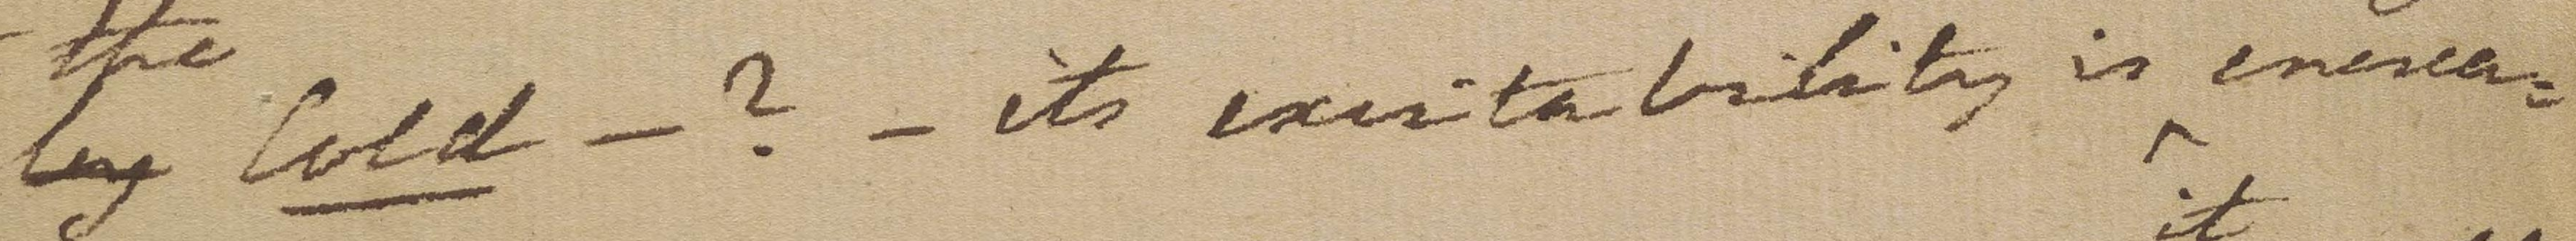[by] Cold-?- its excitability is ^ encrea-
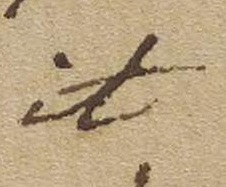it
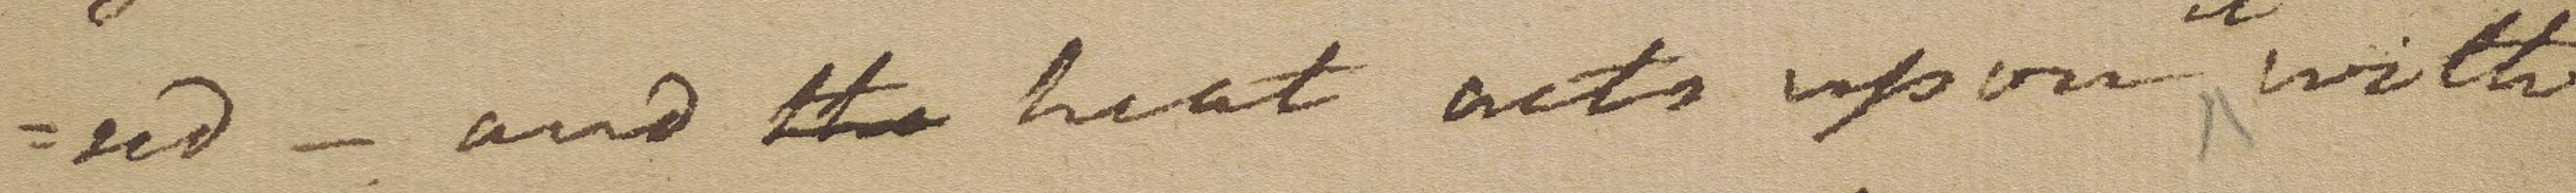-sed- and [the] heat acts upon ^ with
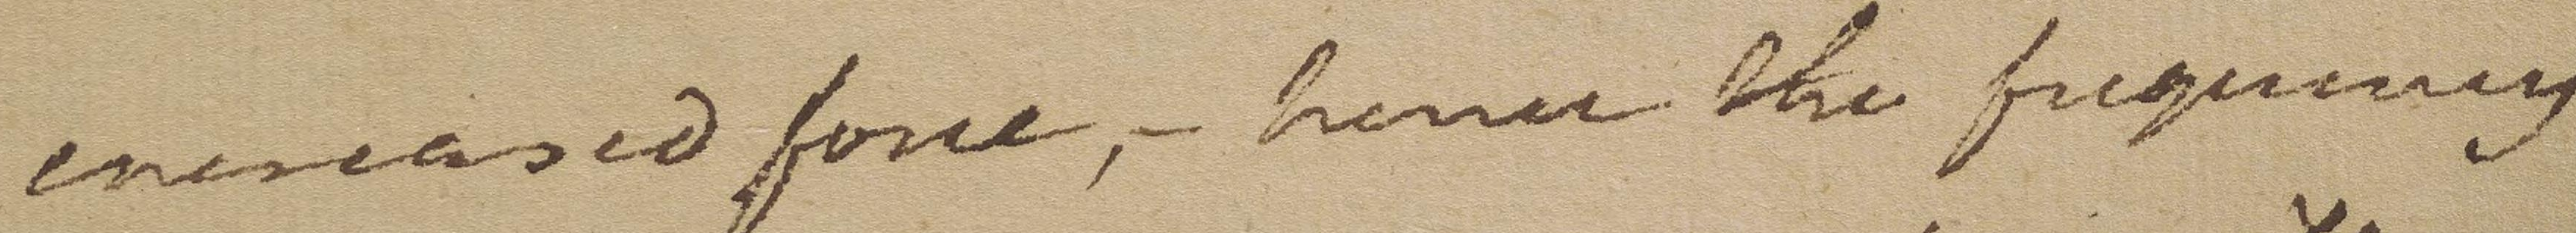encreased force, have the frequency
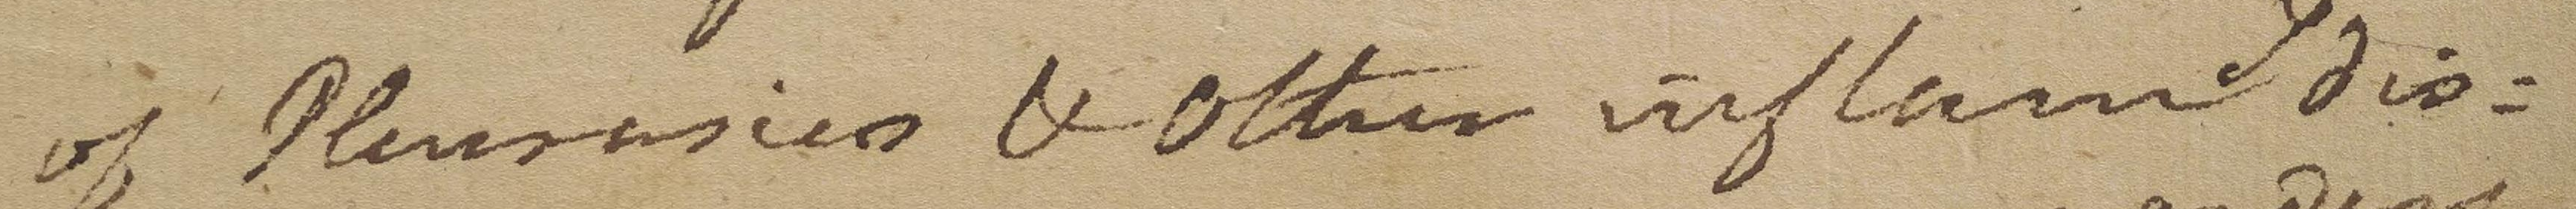of Pleurasies & other inflam^y dis-
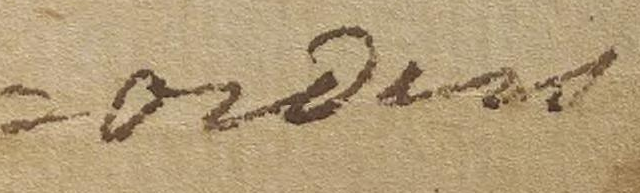-orders
